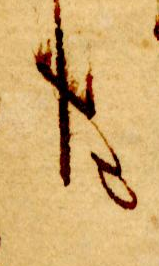at
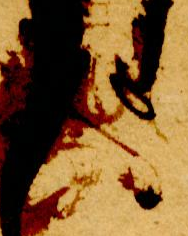To
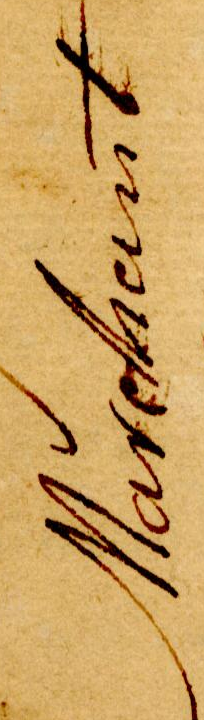Marchant
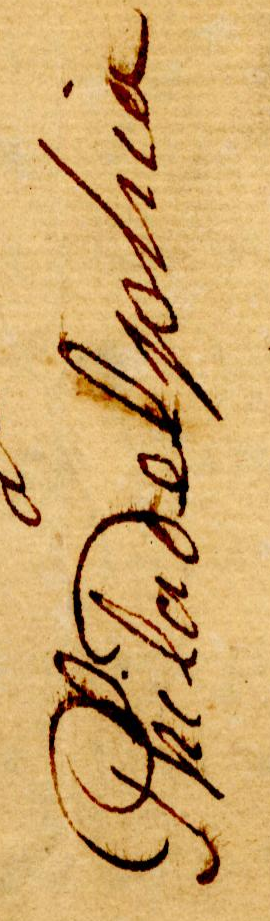Philadelphia
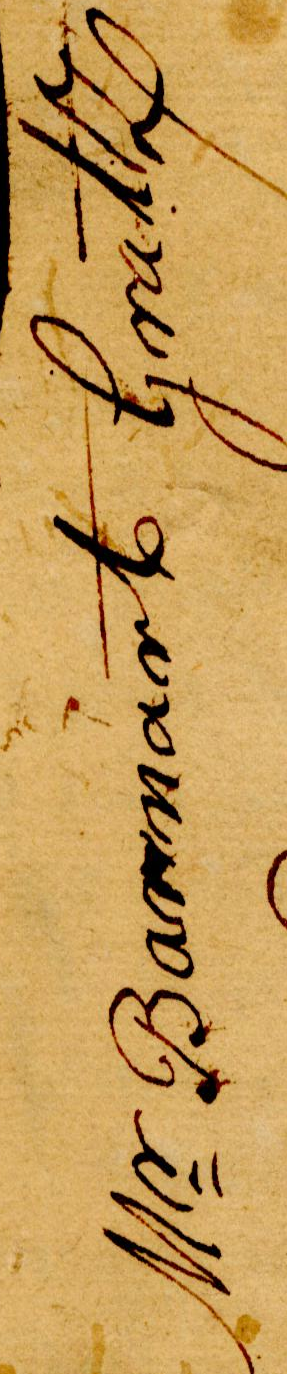M^r Barnart Gratz
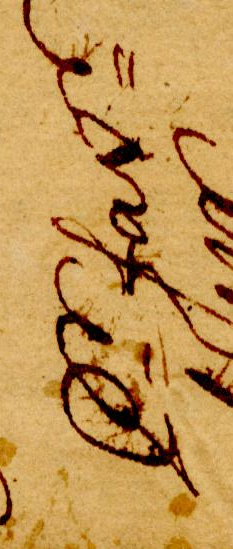P^r fav^r
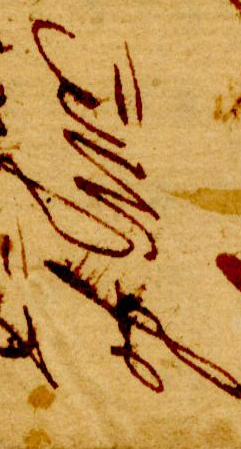of M^r
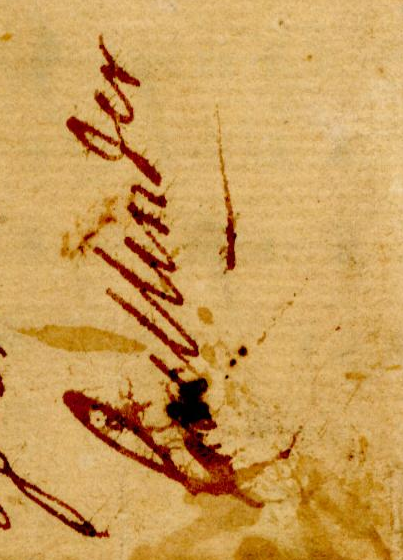Callender
